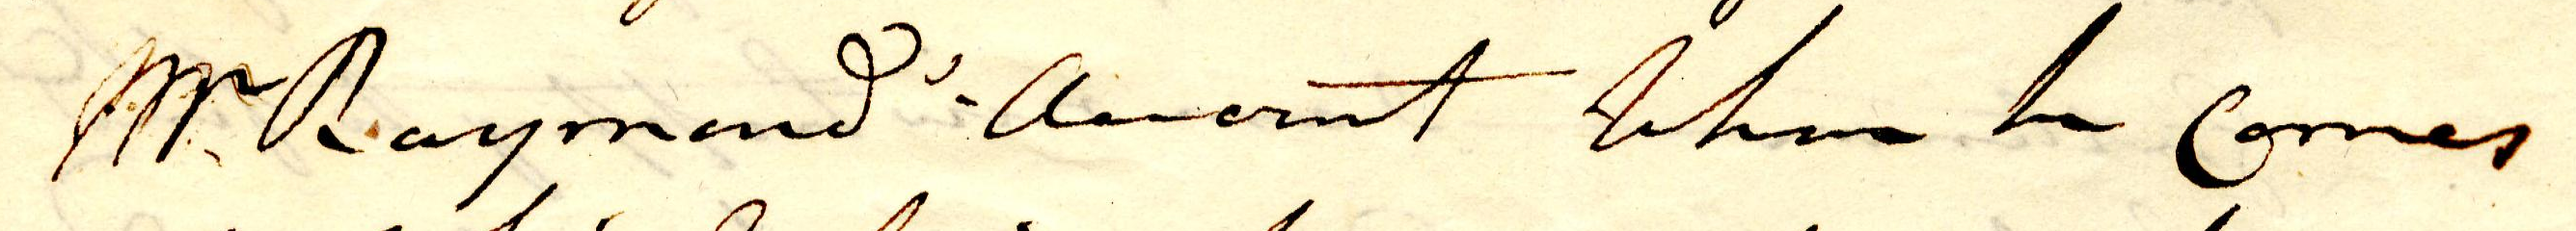M^r. Raymond^s Account when he Comes
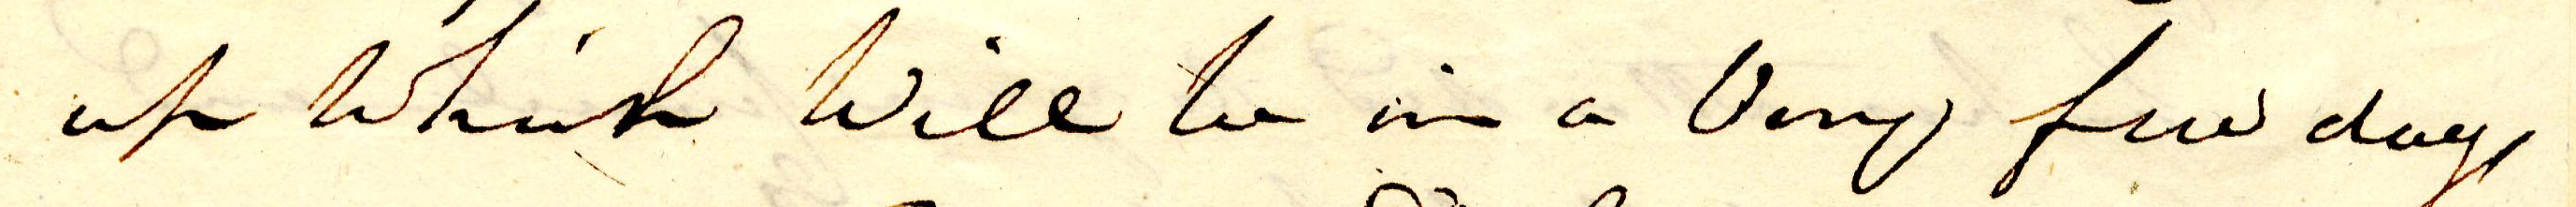up Which Will be in a a Very few days
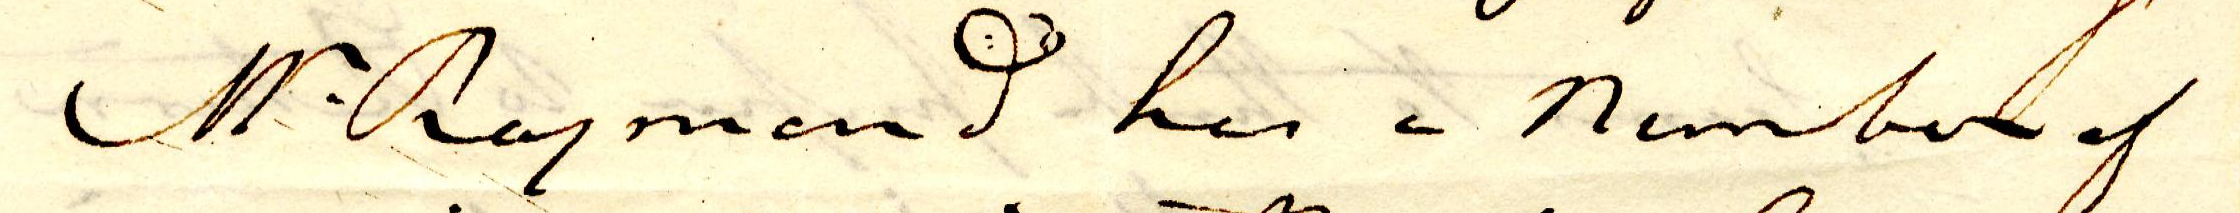M^r. Raymond has a Number of
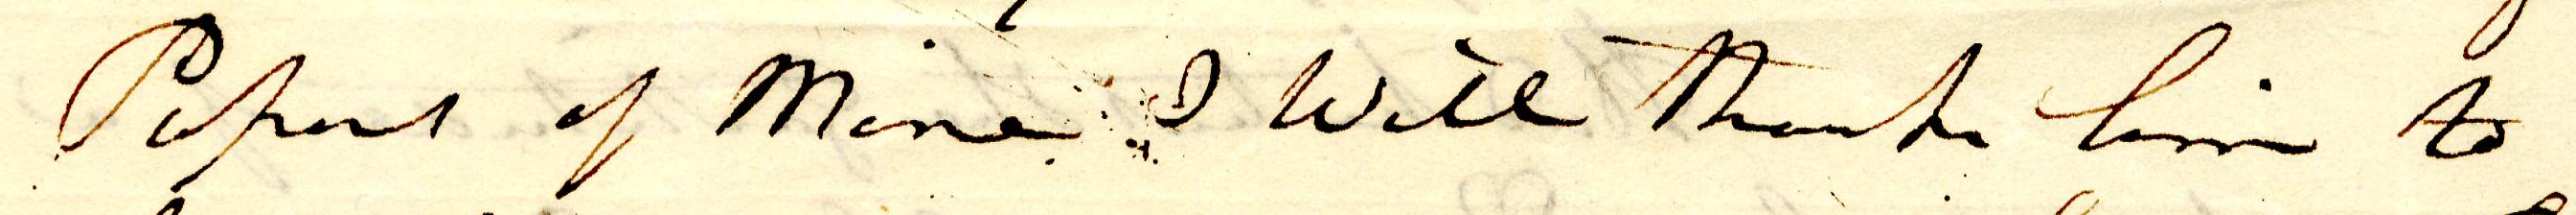Papers of Mine I will thank him to
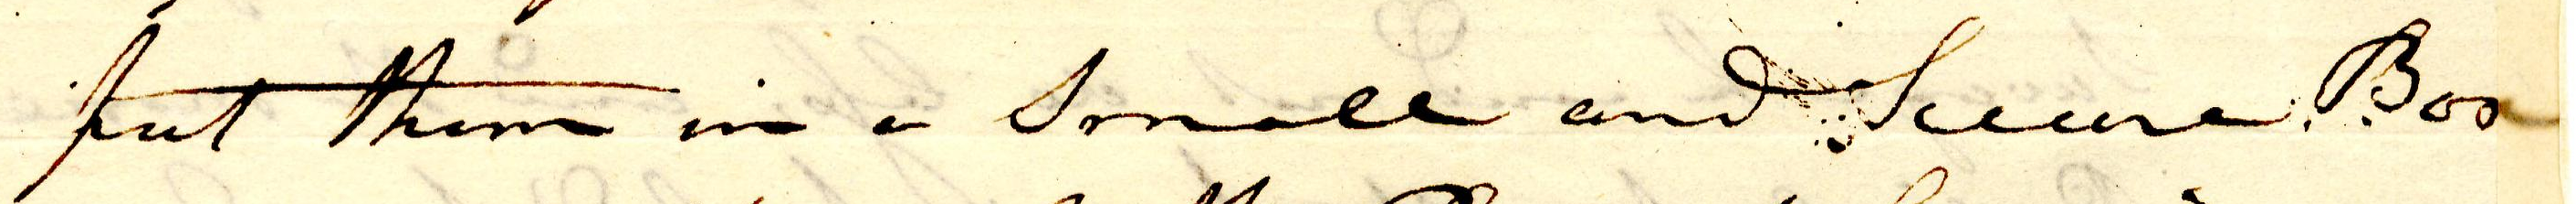put them in a Small and secure Box
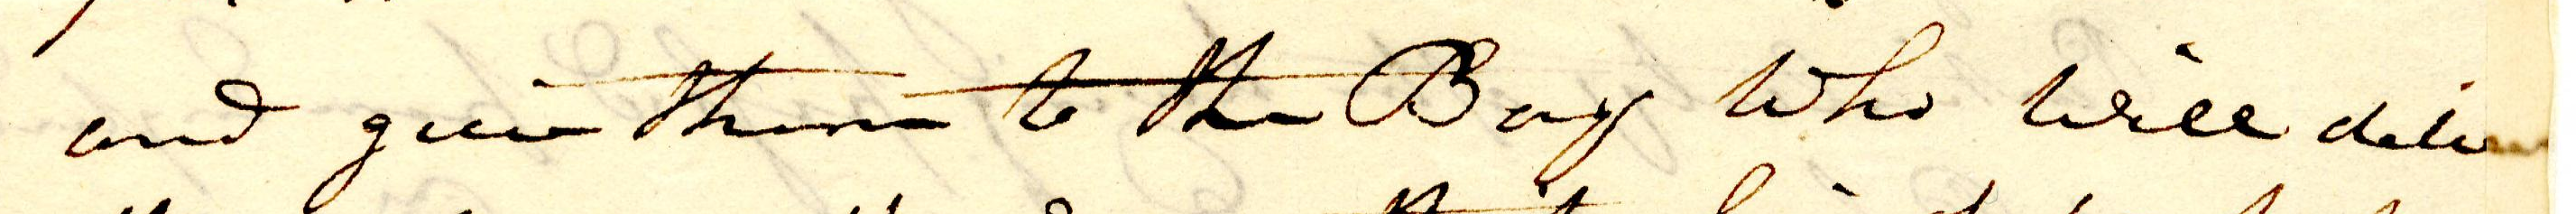and give them to the Boy who will deliver
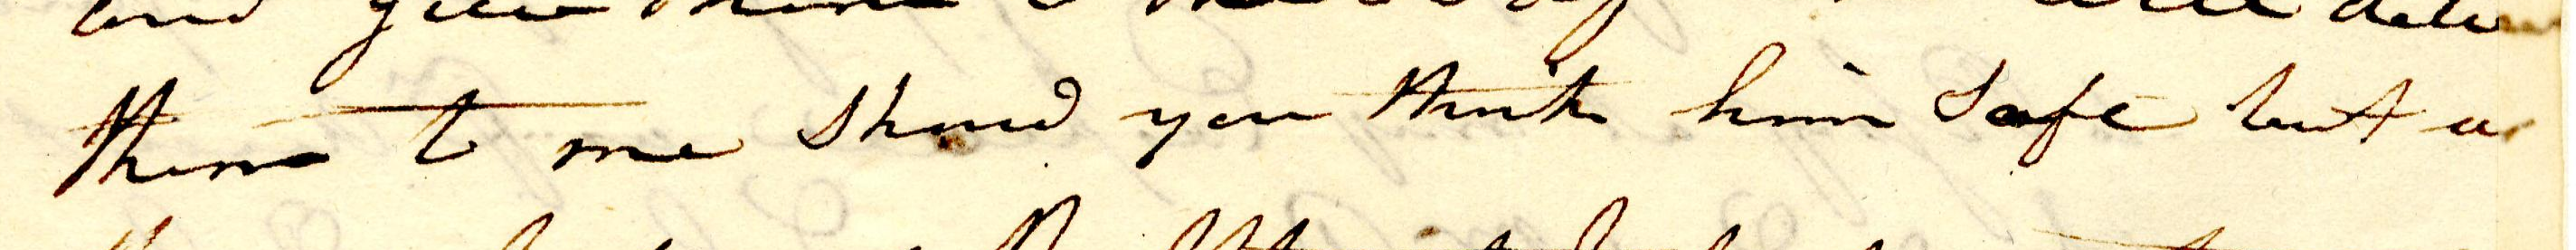them to me should you think him Safe but as
